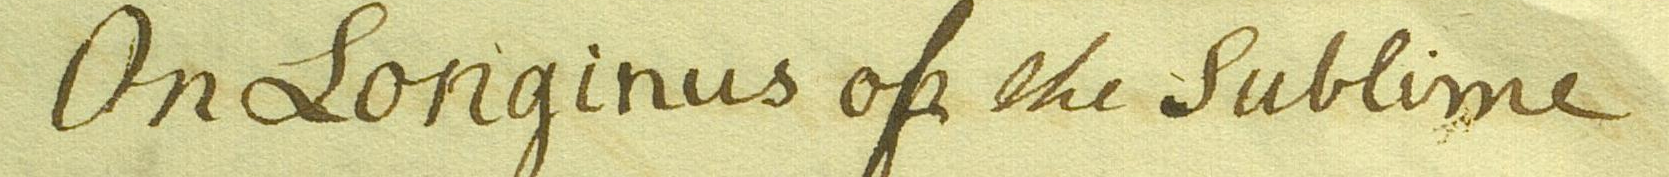On Longinus of the Sublime
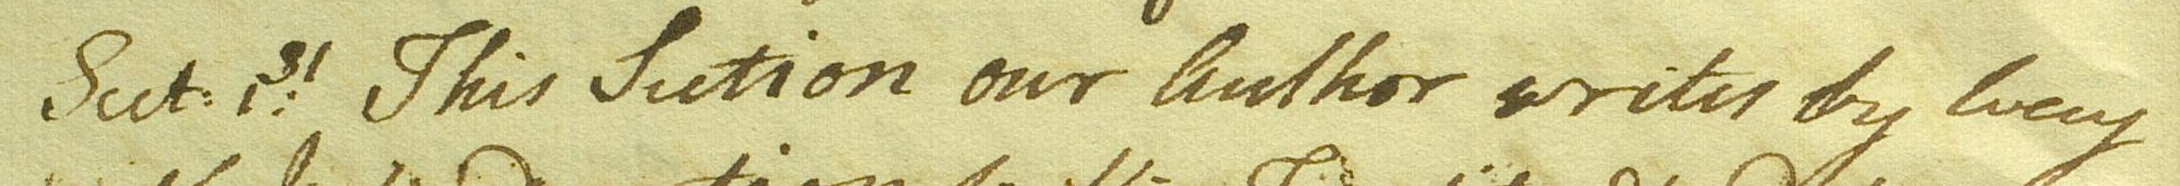Sect 1^31: This Section our Author writes by way
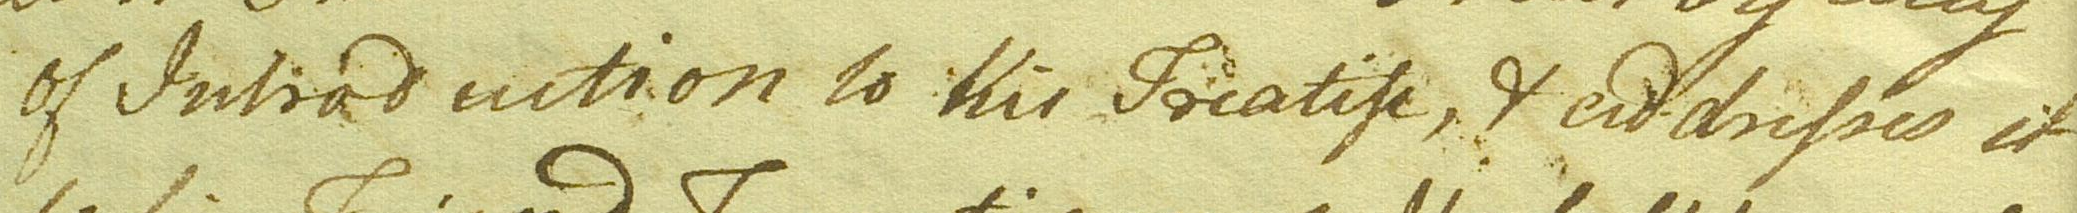of Introduction to this Treatise, & Addresses it
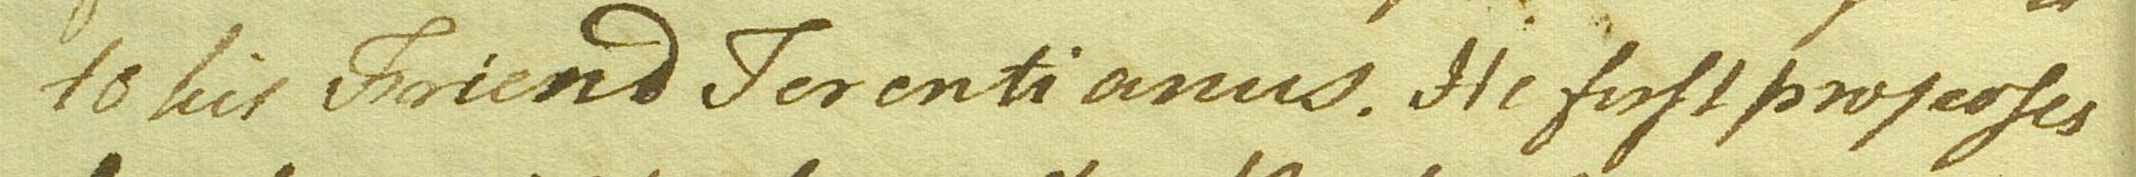to his Friend Terentianus. He first proposes
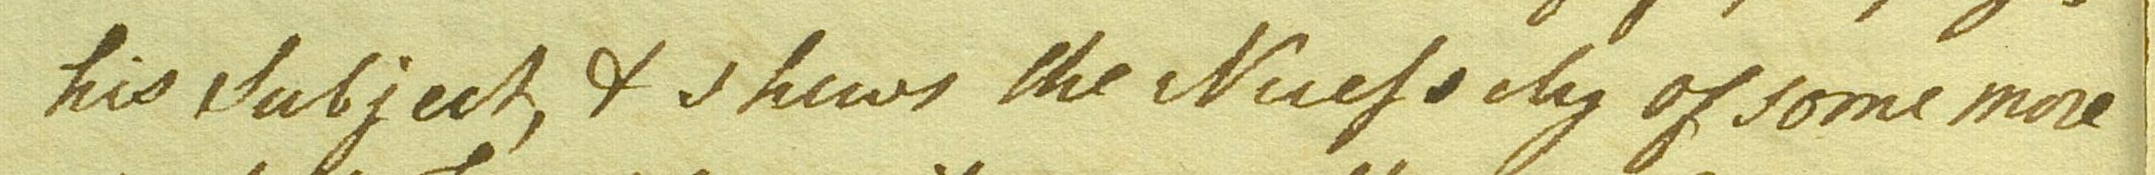his Subject, & shews the Necessity of some more
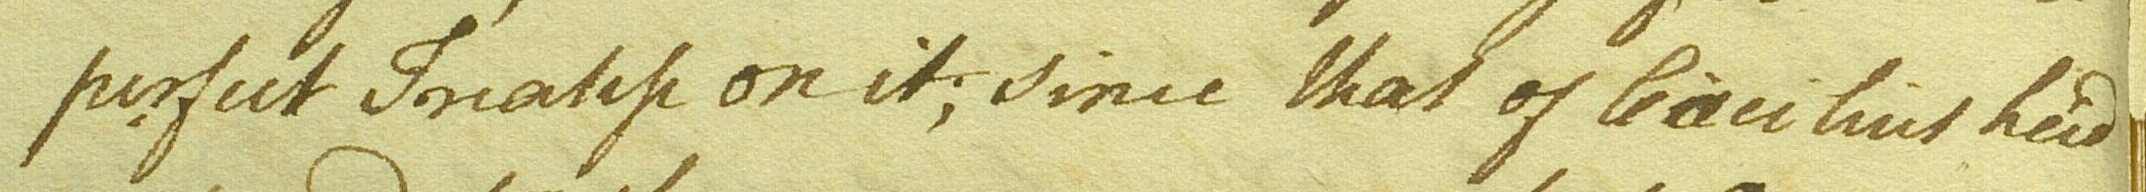perfect Treatise on it; since that of Caecilius held
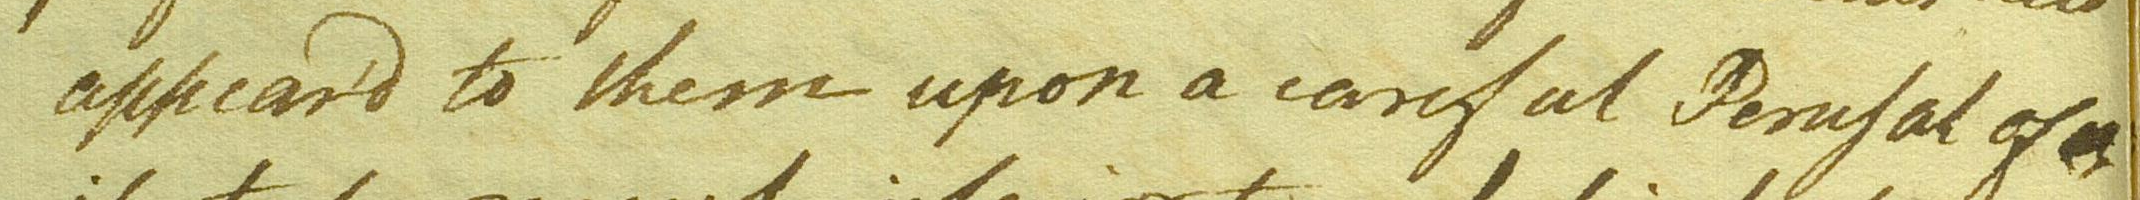appeared to to them upon a careful Perusal of [_]
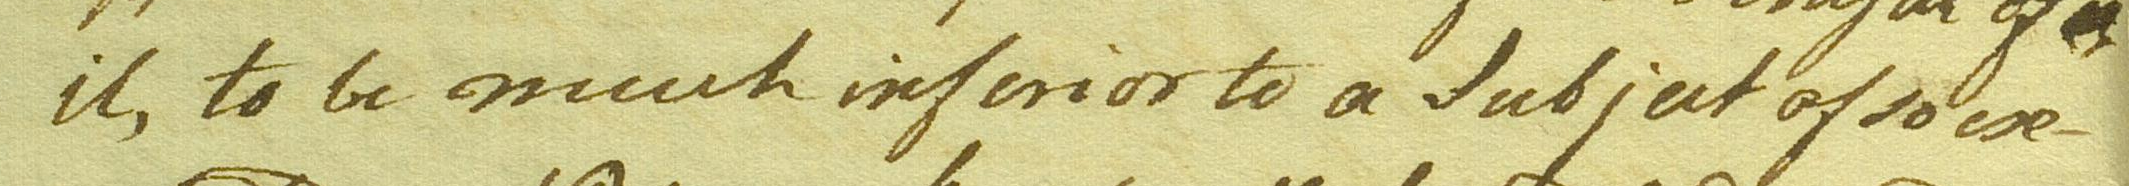it, to be much inferior to a Subject of so ese-
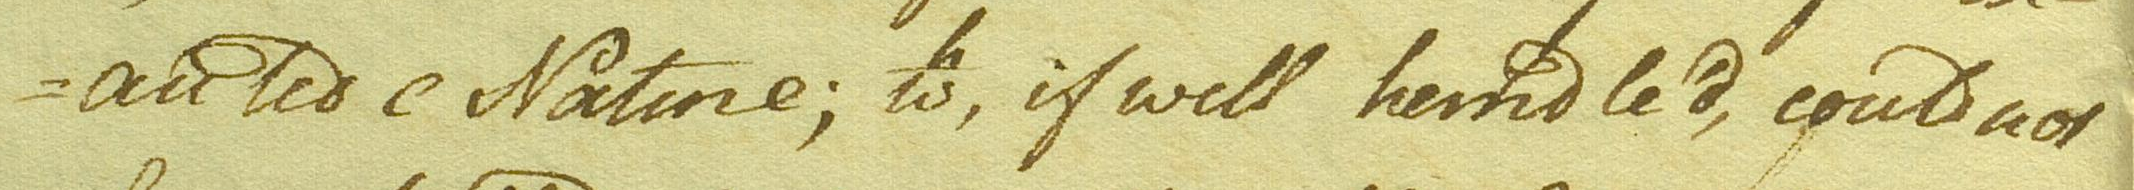ecuted a Nature; w^h, if well handled could not
